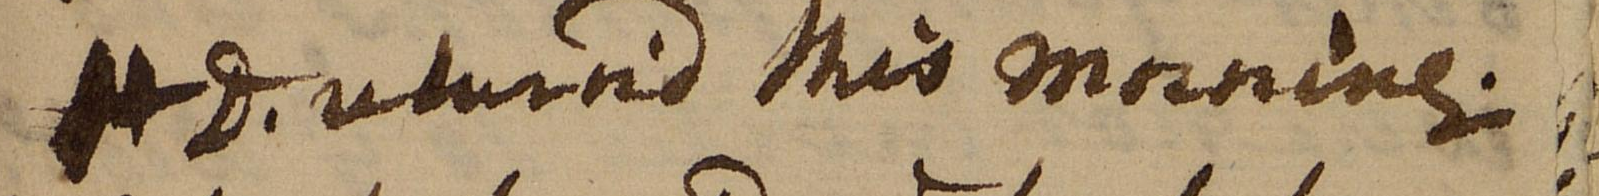HD. return'd this morning.
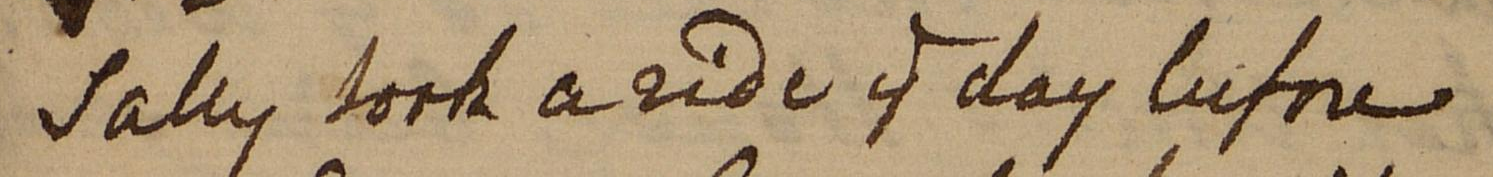Sally took a ride y^e day before
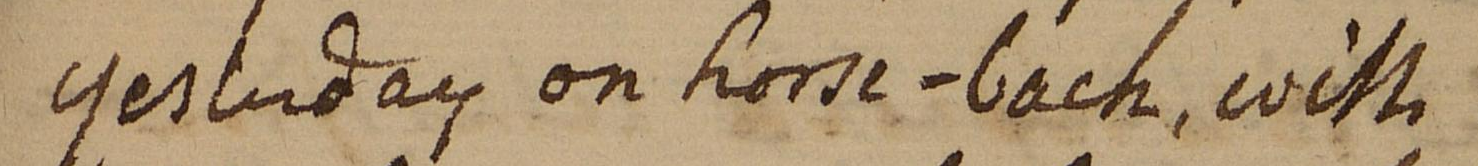yesterday on horse-back, with
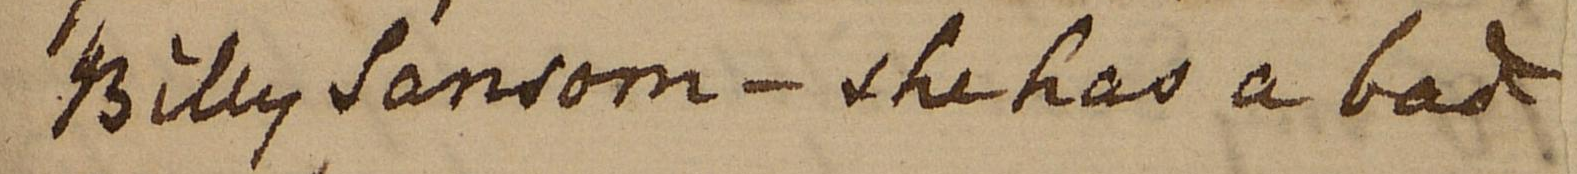Billy Sansom- she has a bad
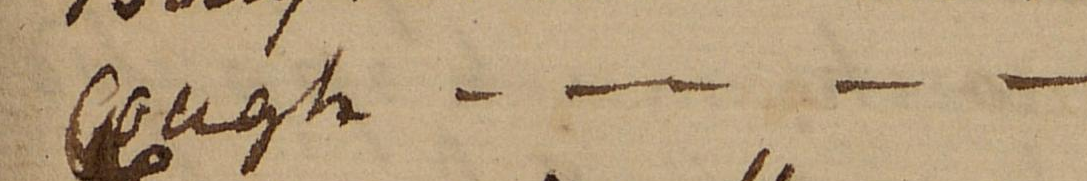Cough----
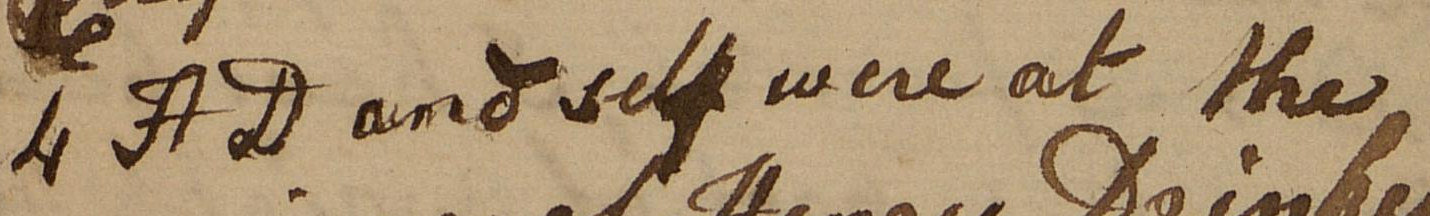4 HD and self were at the
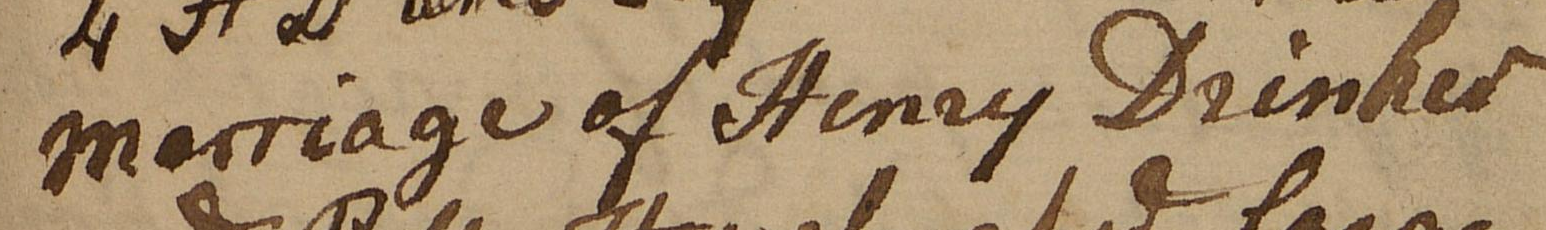Marriage of Henry Drinker
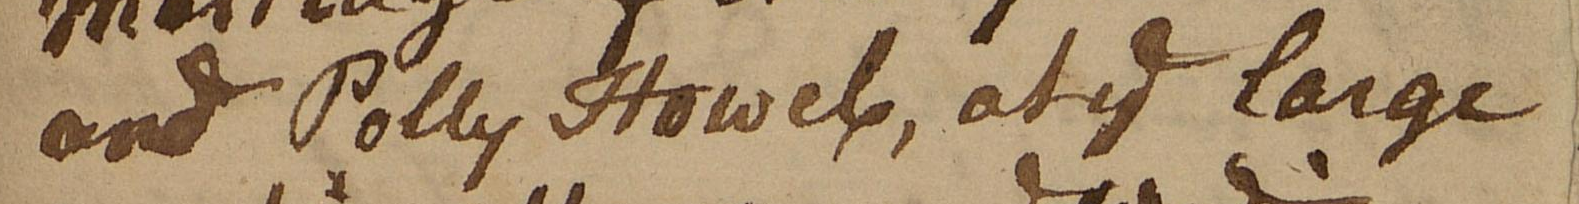and Polly Howel, at y^e large
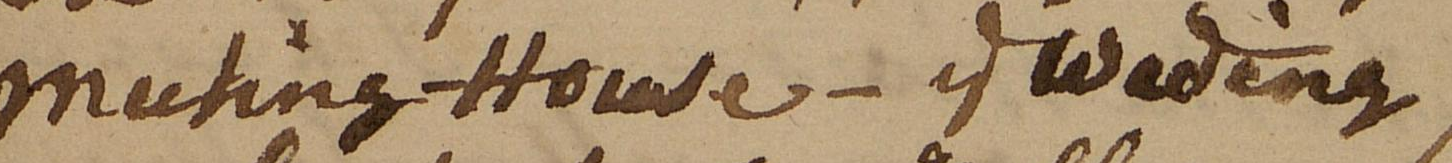Meeting-House- y^e Wading
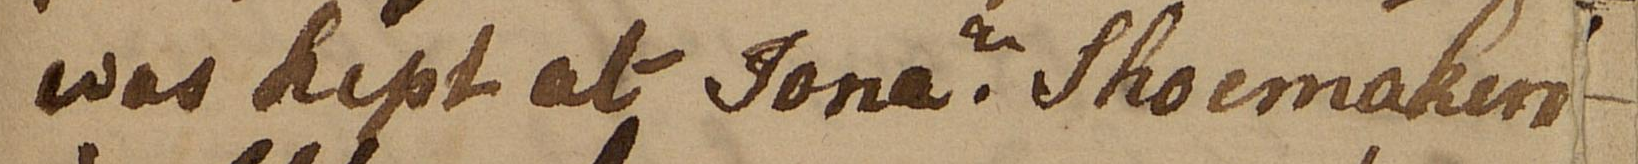was kept at Jona^n. Shoemakers
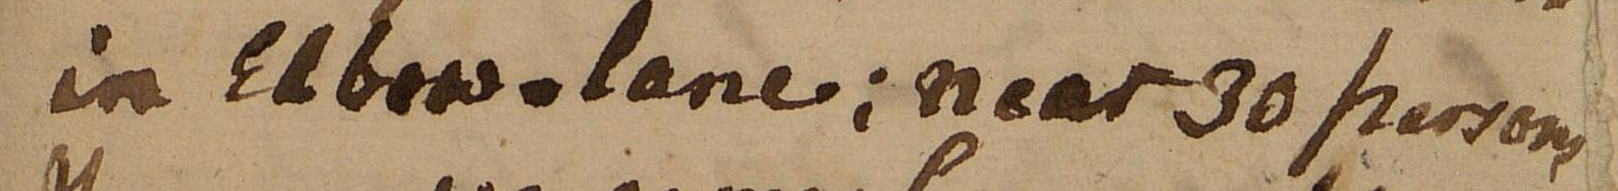in Elbow-lane; near 30 persons
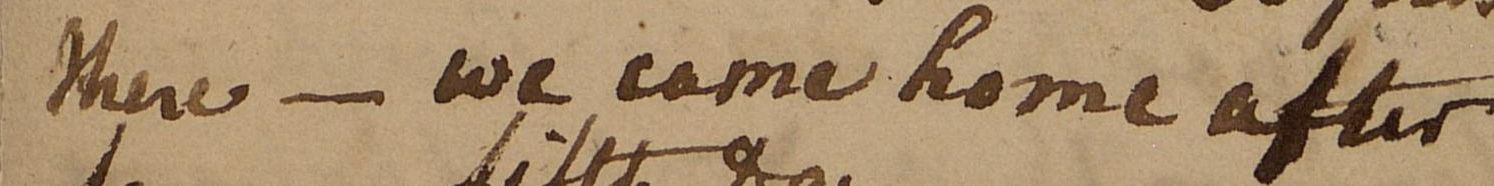there- we came home after
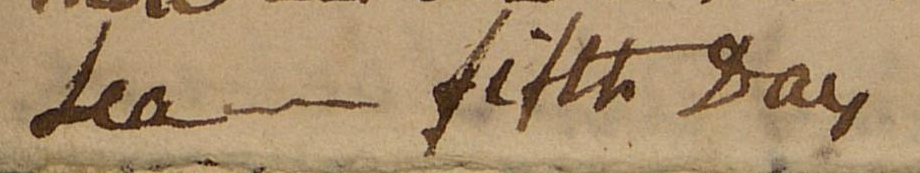tea- fifth Day
